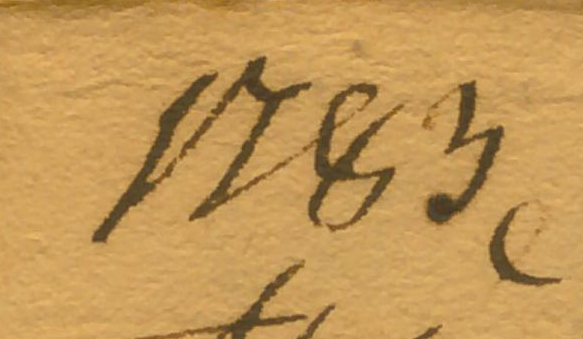1783
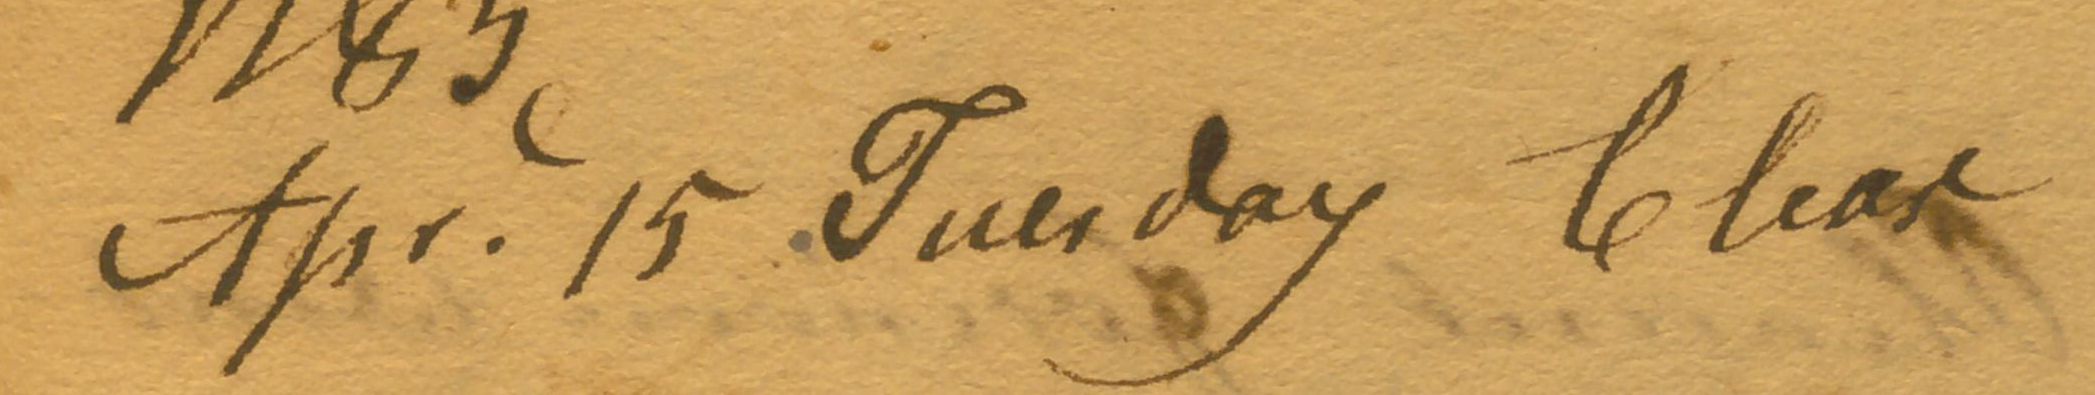Apr^l. 15 Tuesday Clear
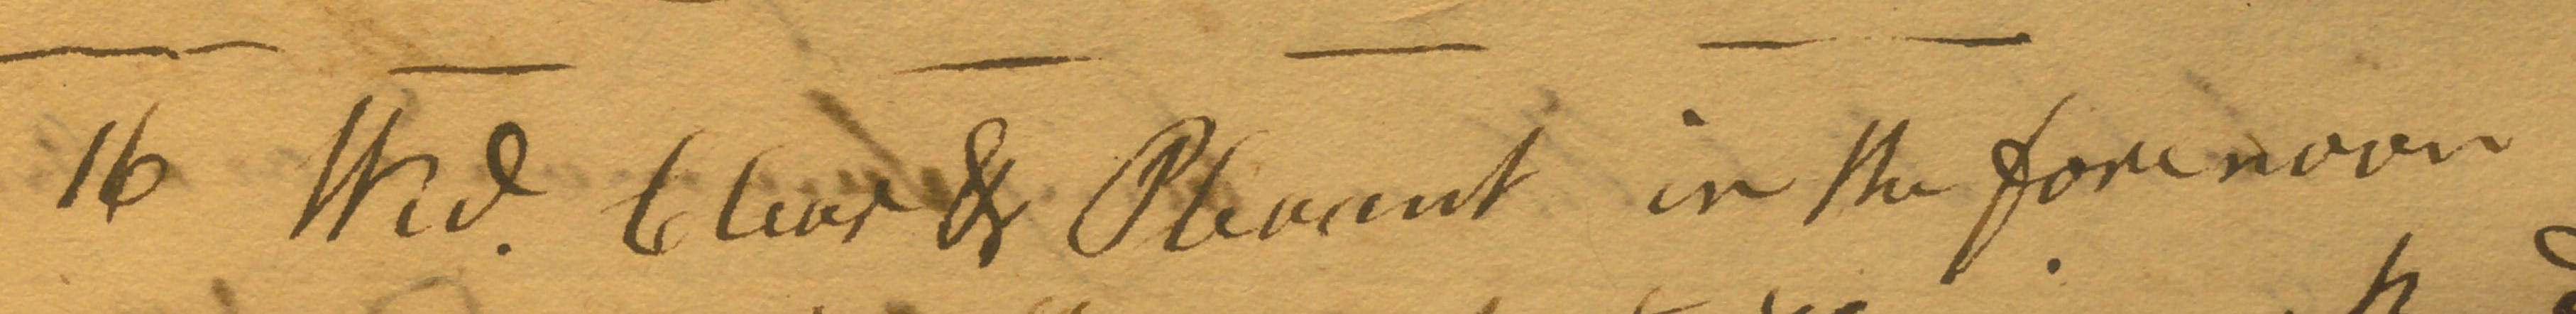16 Wed Clear & Pleasent in the forenoon
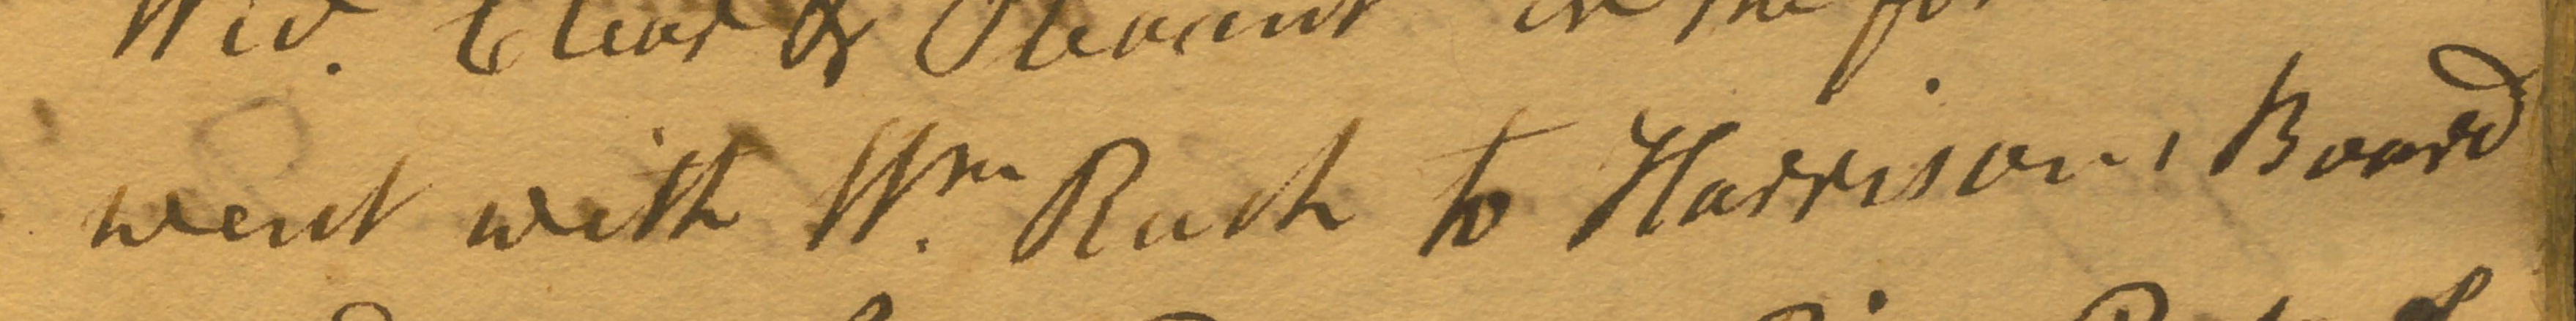went with W^m. Rush to Harrisons Board
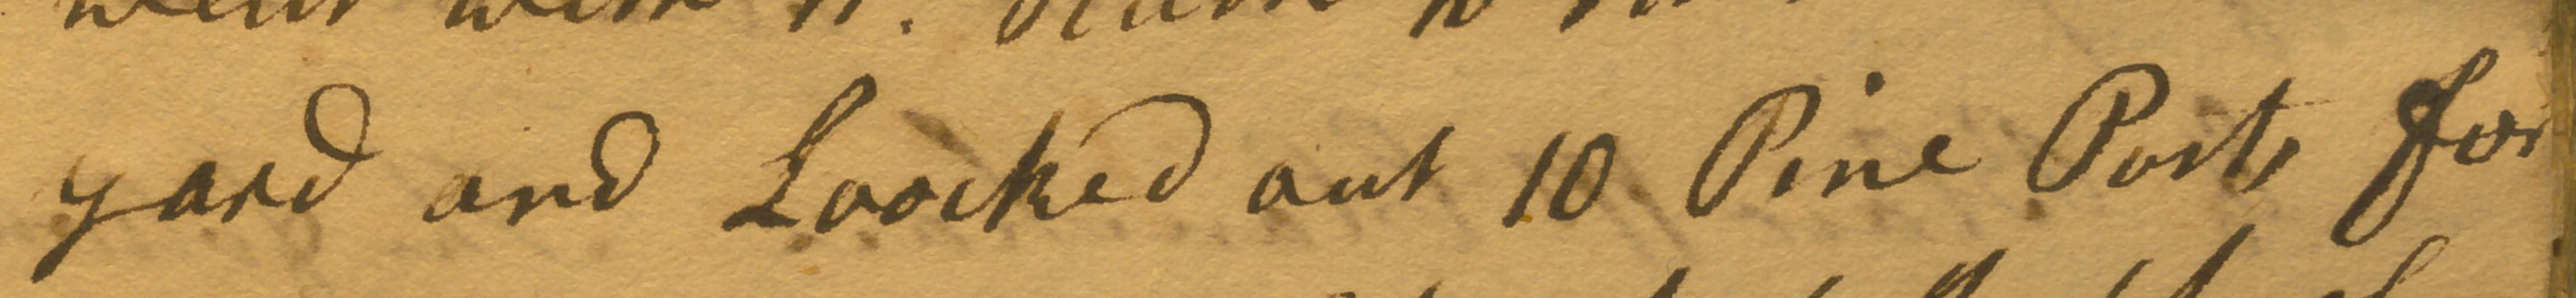yard and Loocked out 10 Pine Posts for
